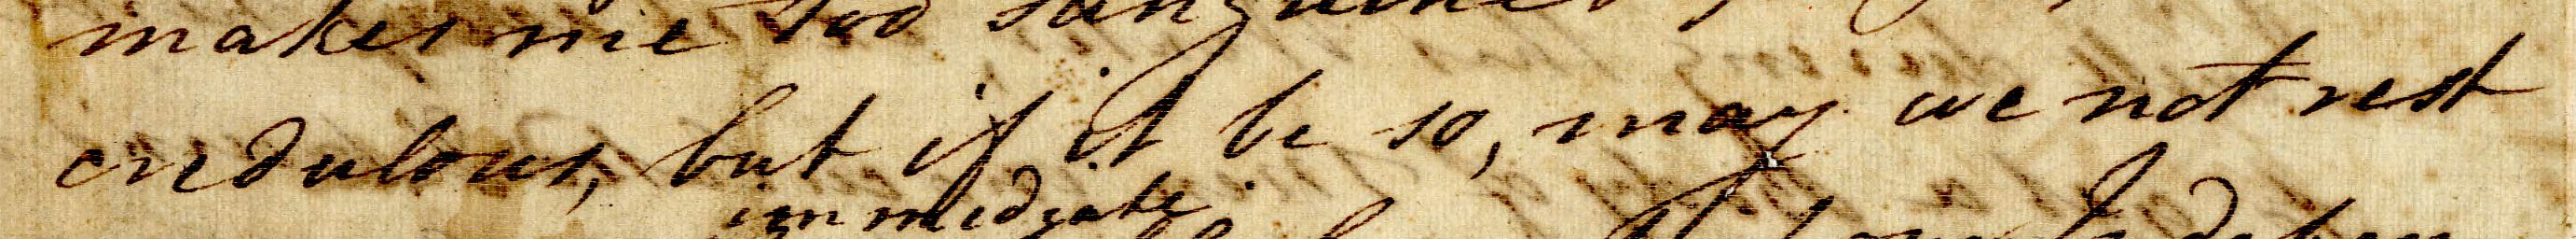credulous, but if it be so, may we not rest
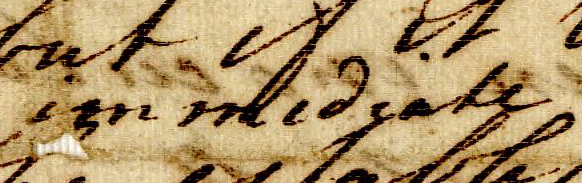immediate
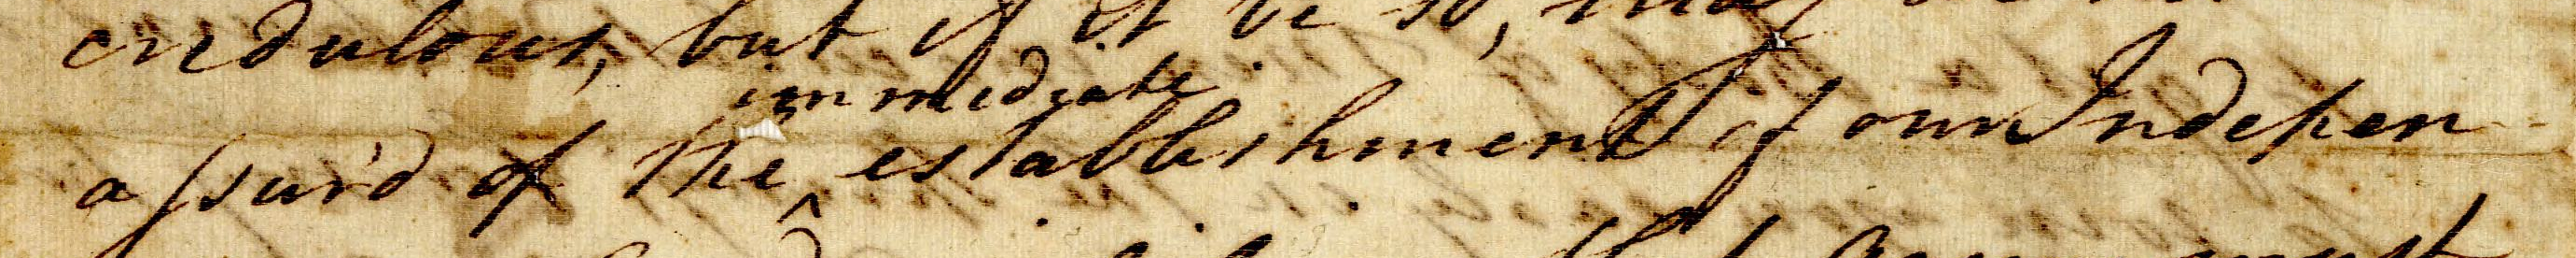assur'd of the ^ establishment of our Indepen
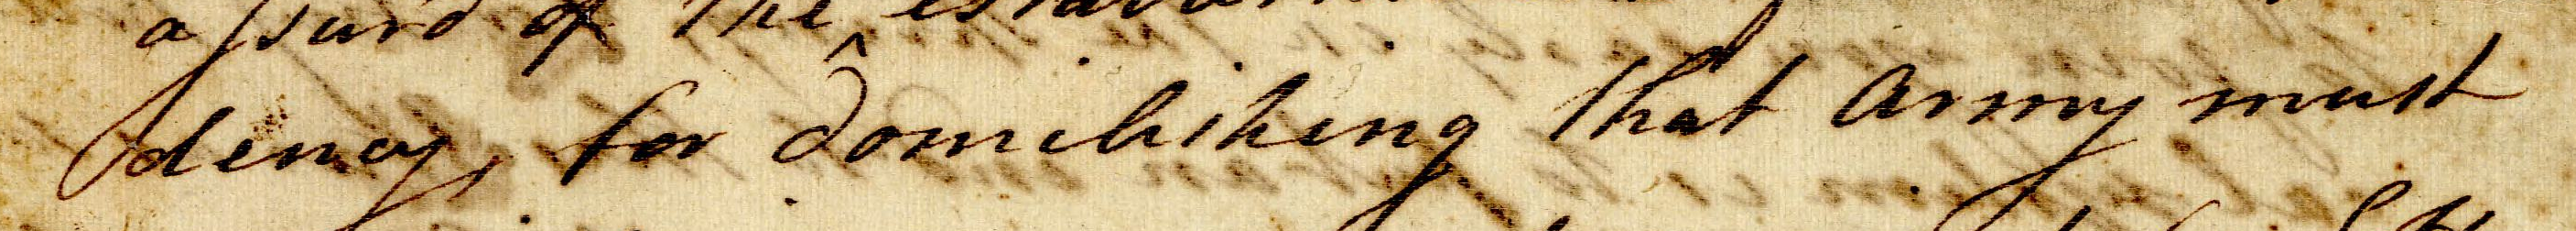dency, for domihihing that Army must
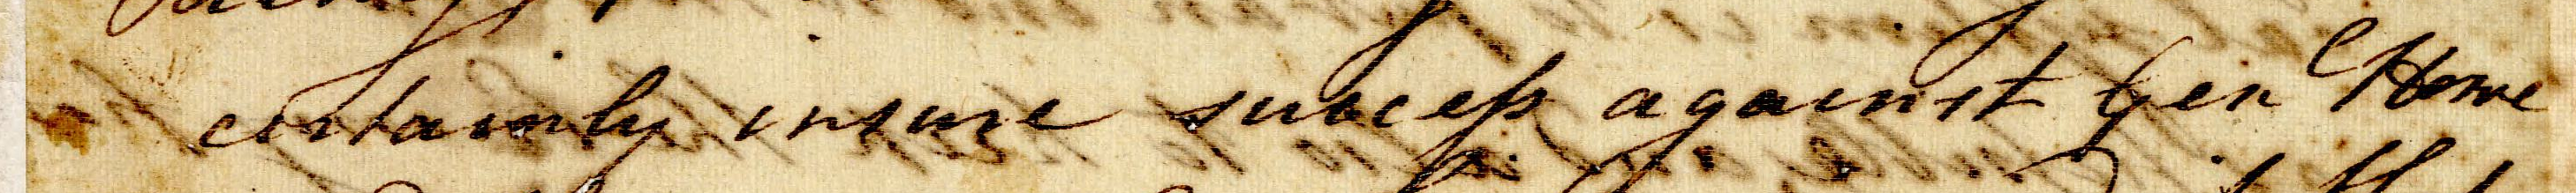certainly insure success against Gen^l. Howe
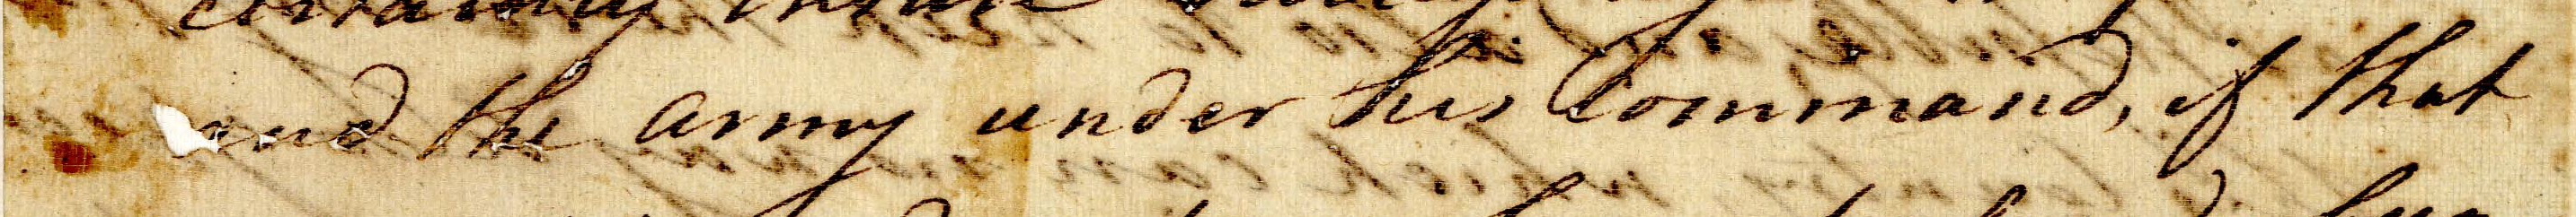and the army under his command, if that
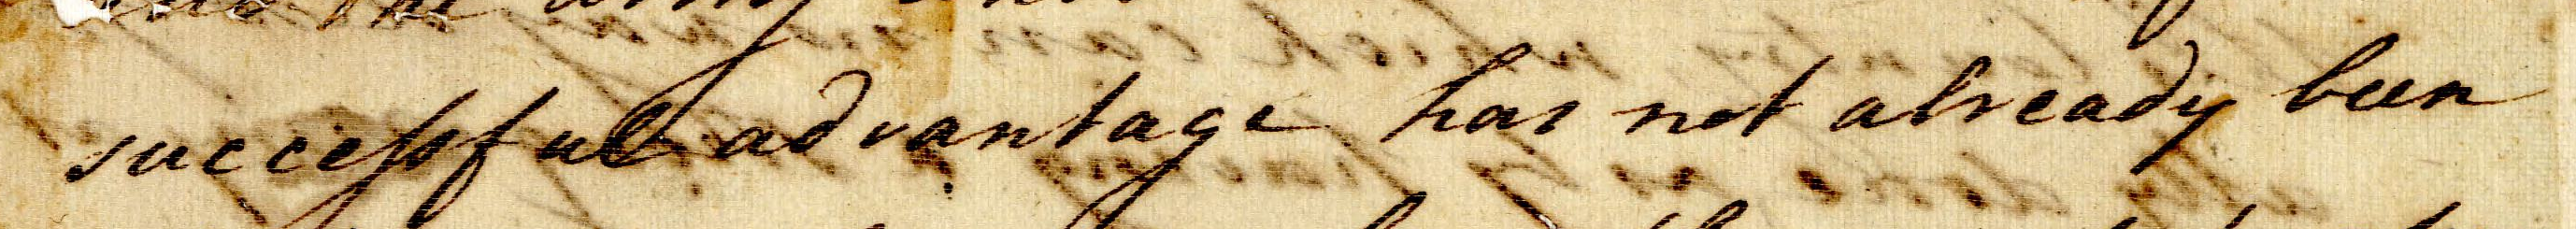successful advantage has not already been
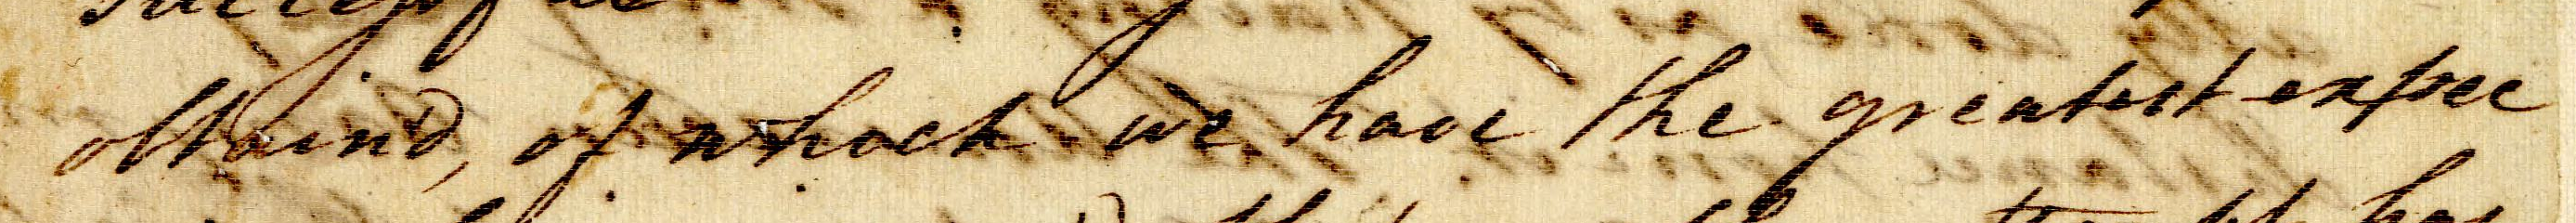obtain'd, of which we have the greatest expec
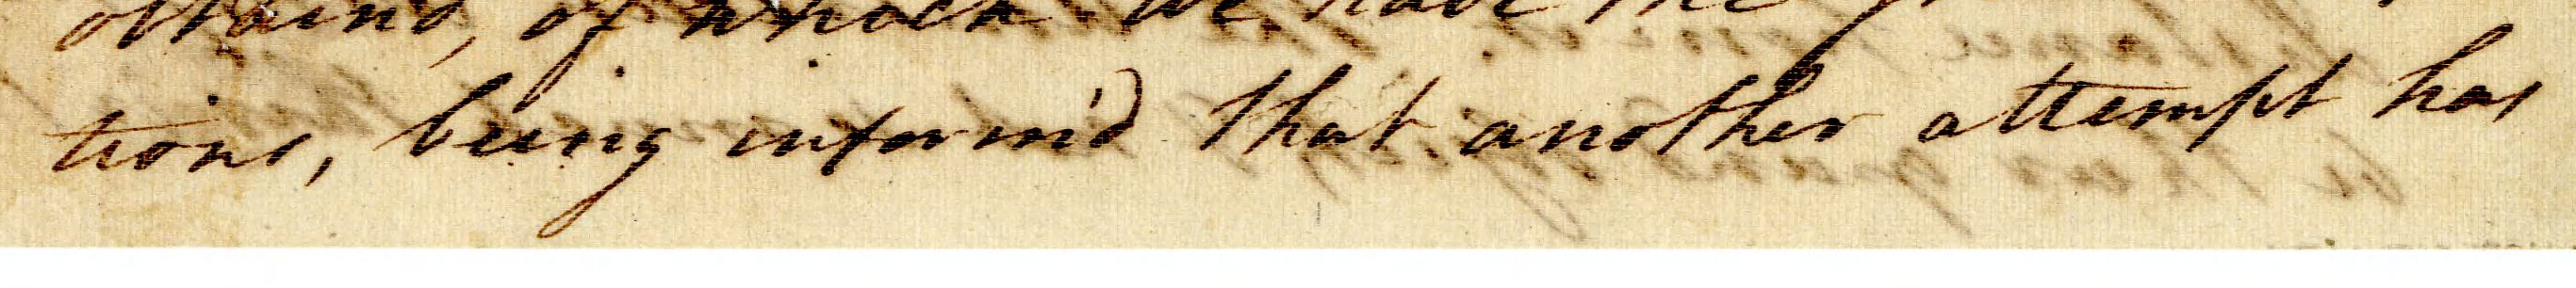tions, being inform'd that another attempt has
